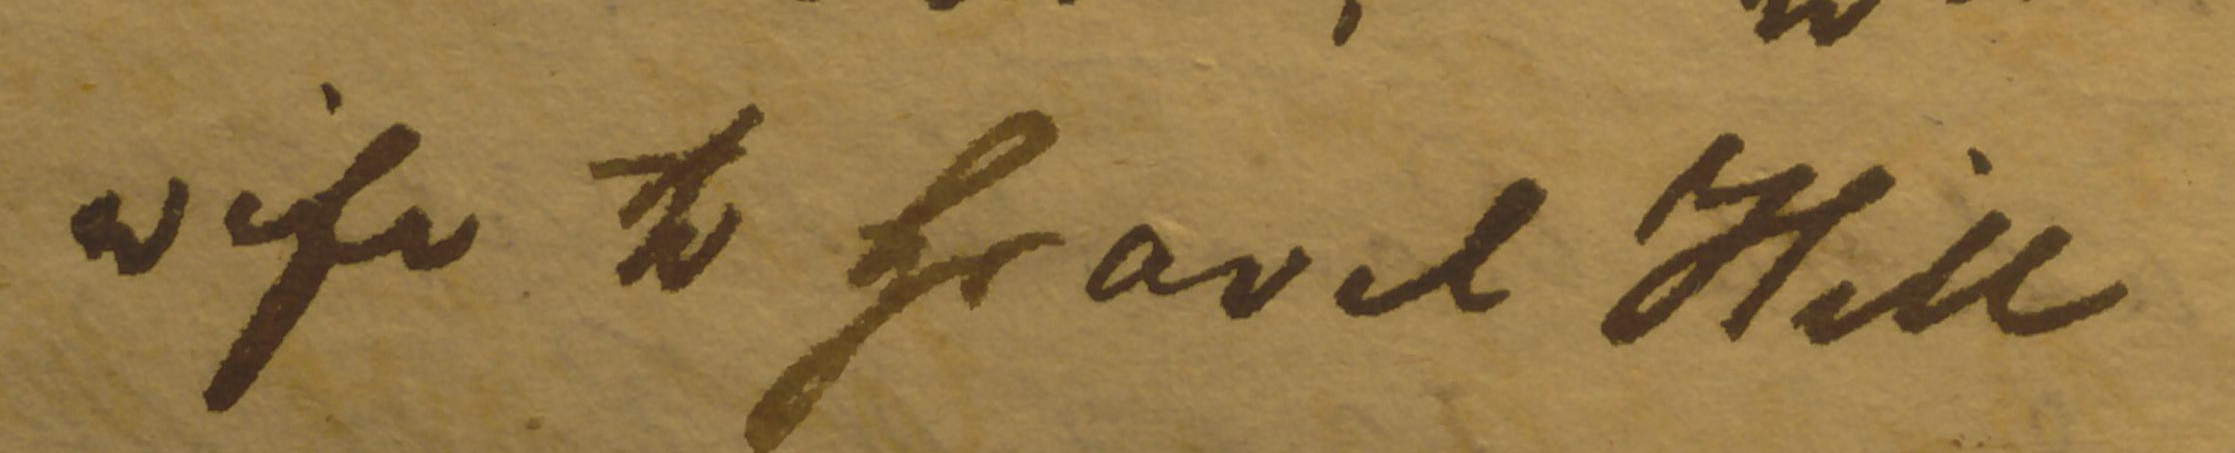wife to Gravel Hill
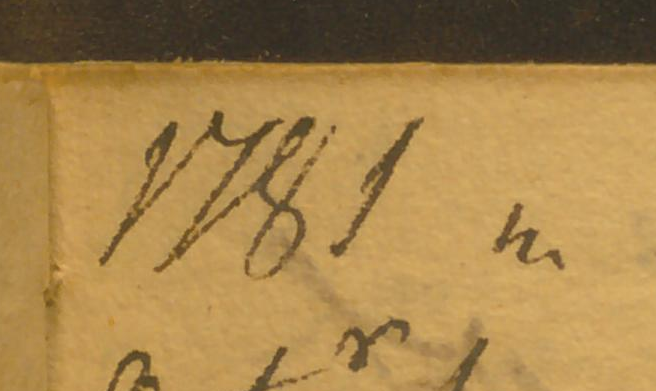1781
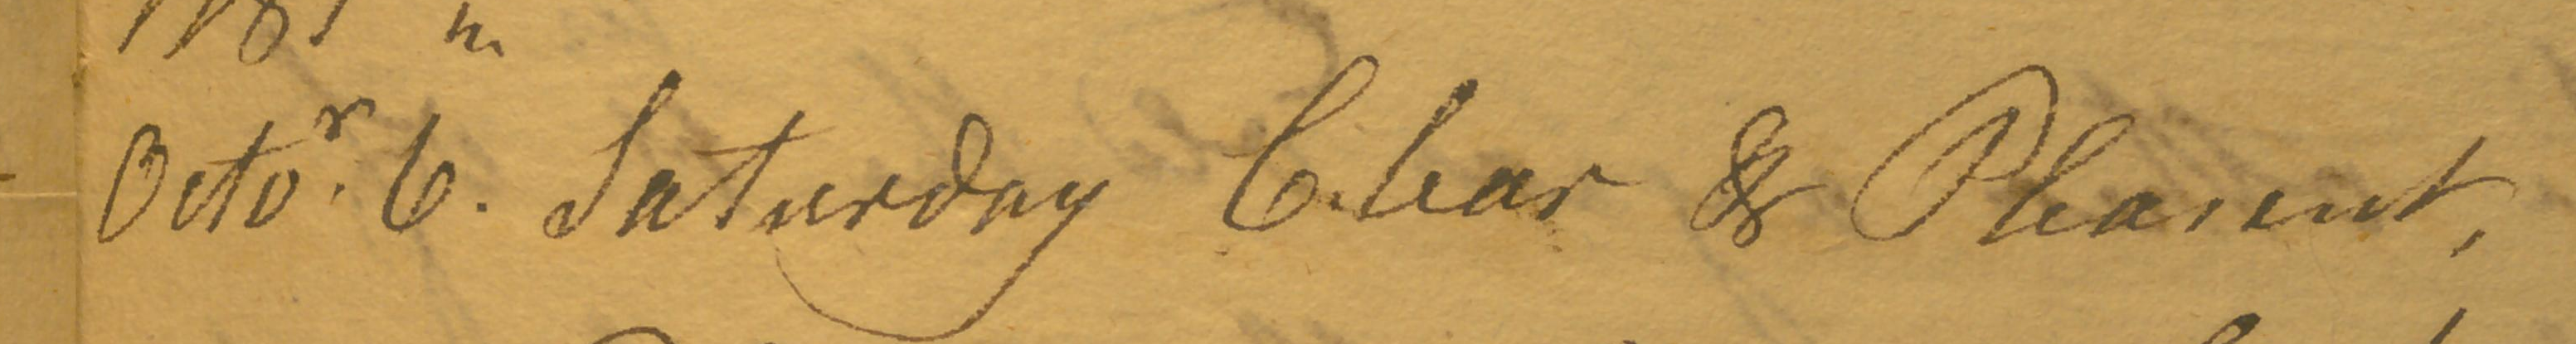Octo^r. 6th. Saturday Clear & Pleasent
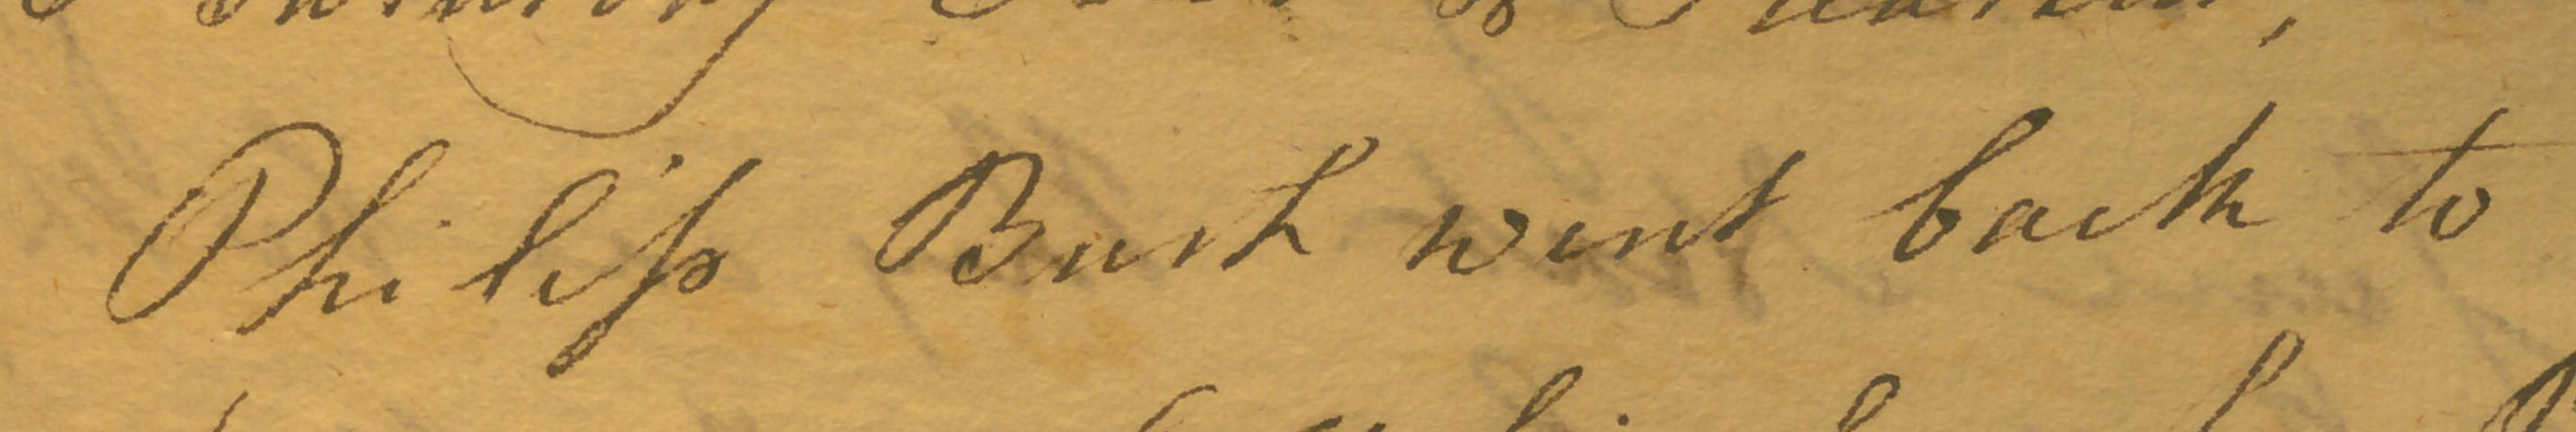Philip Bush went back to
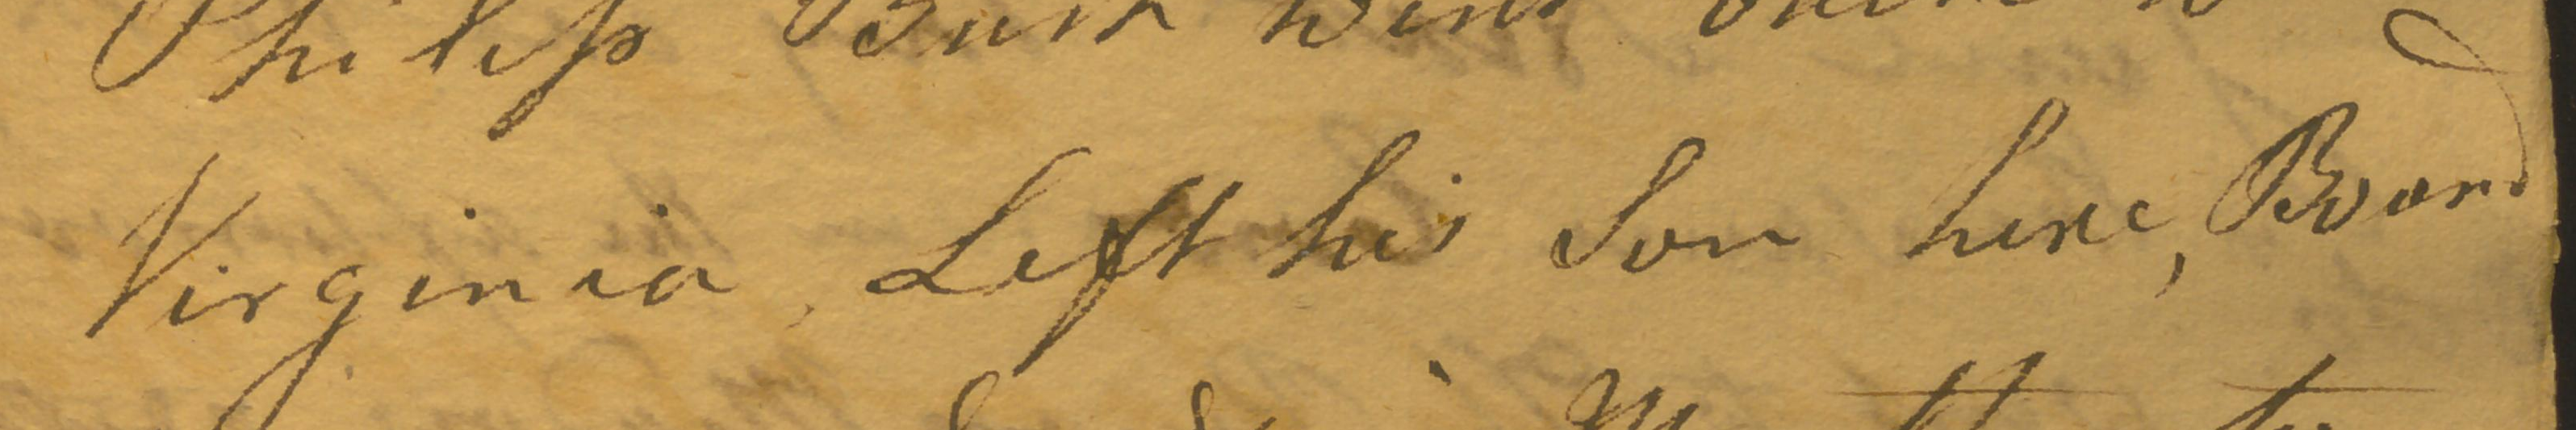Virginia Left his Son here, Board
